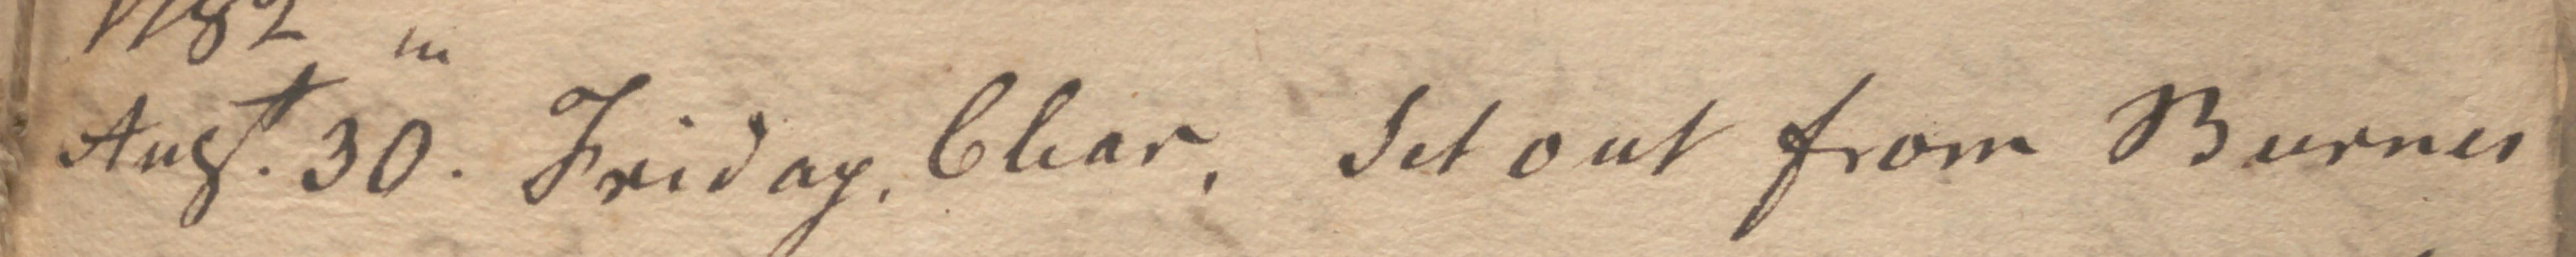Aug^t. 30^h. Friday. Clear, set out from Burnes
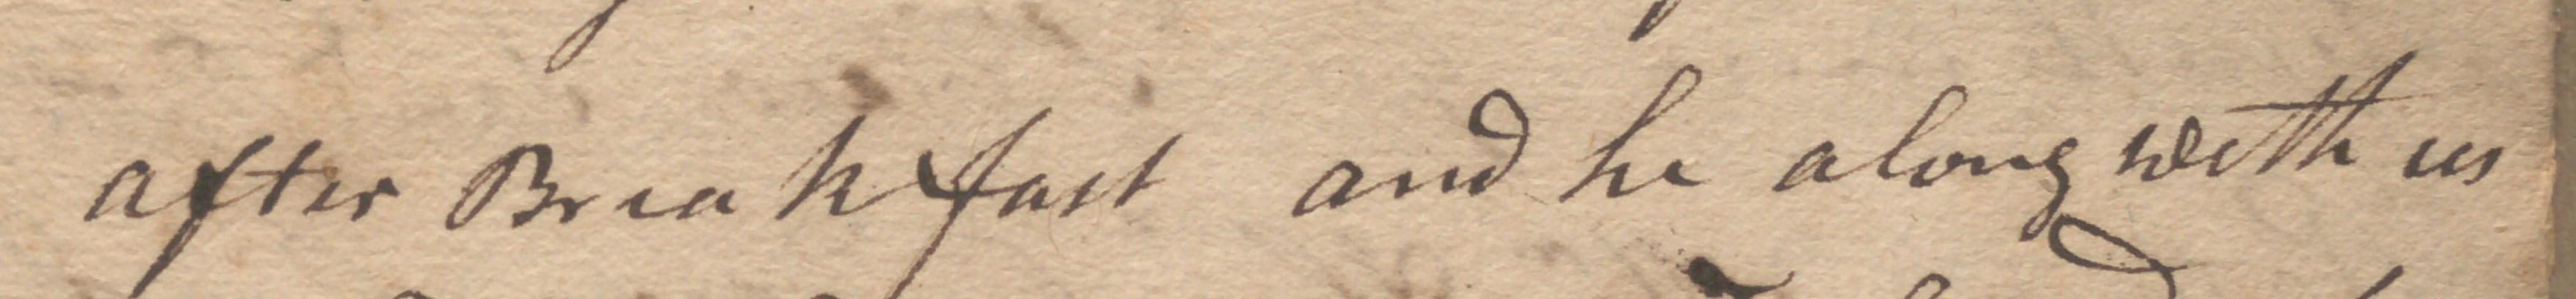after Breakfast and he along with us
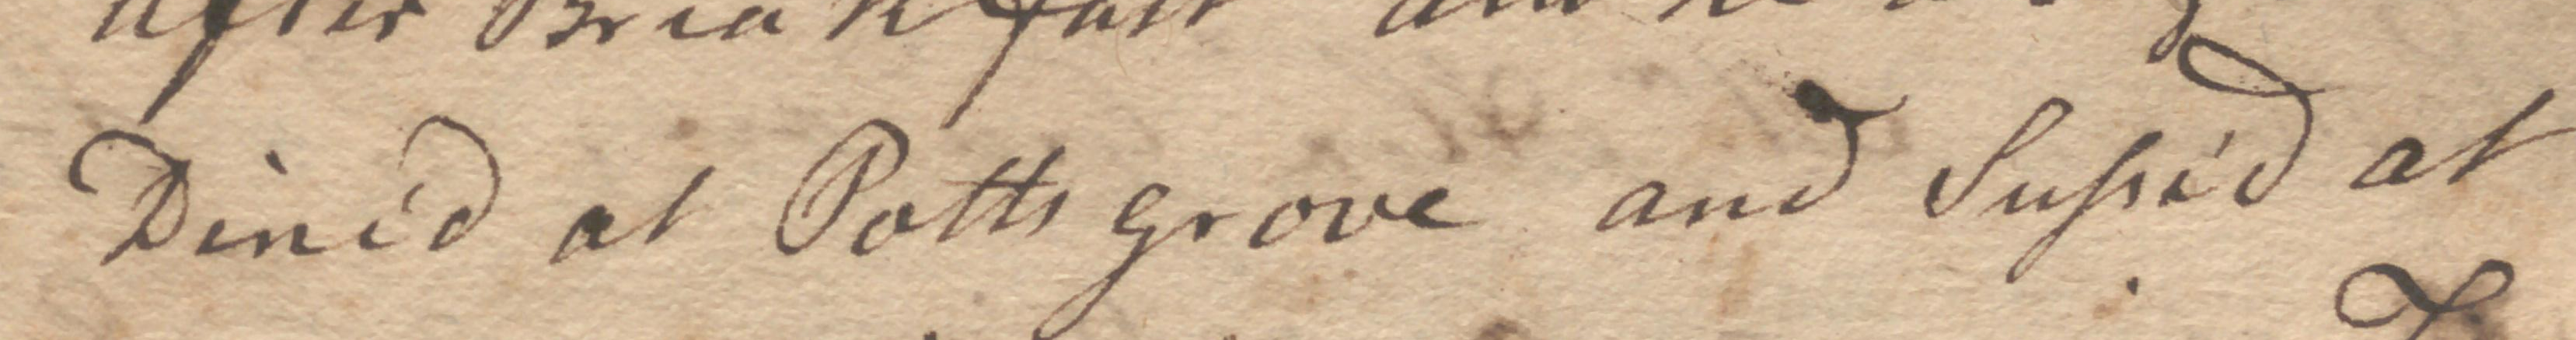Dine'd at Potts grove and Supe'd at
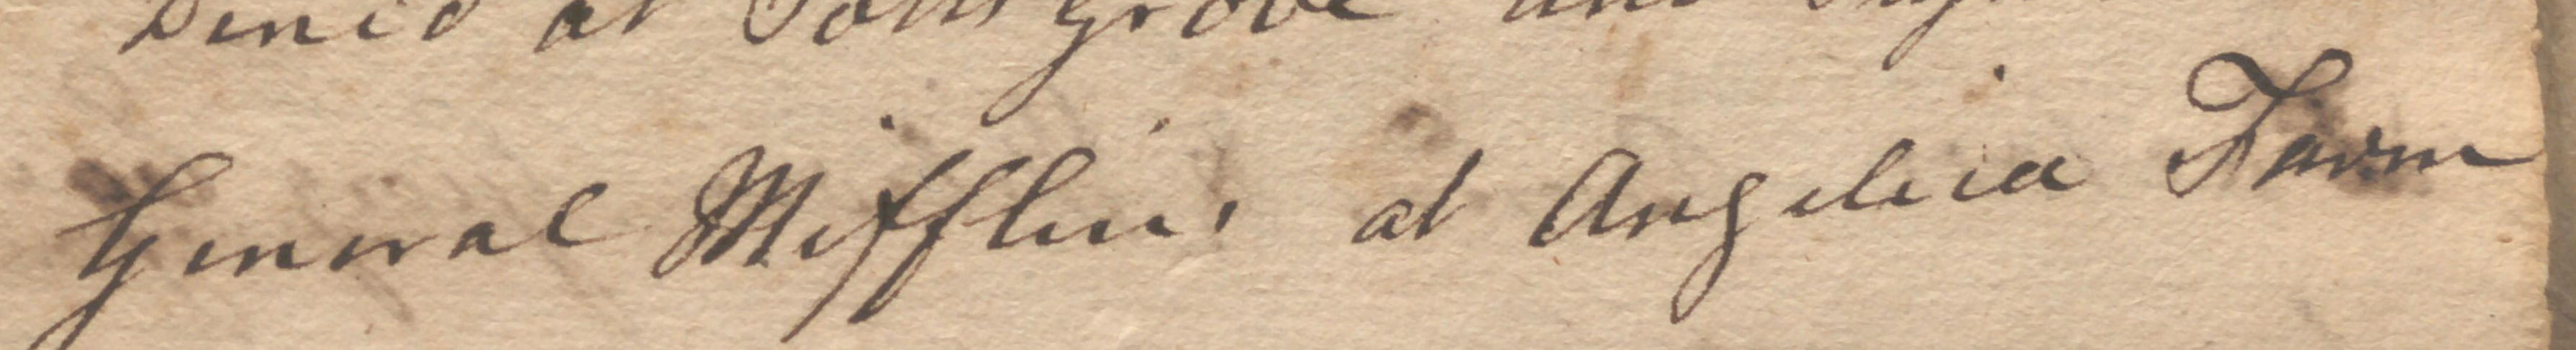General Mifflins at Angelica Farm
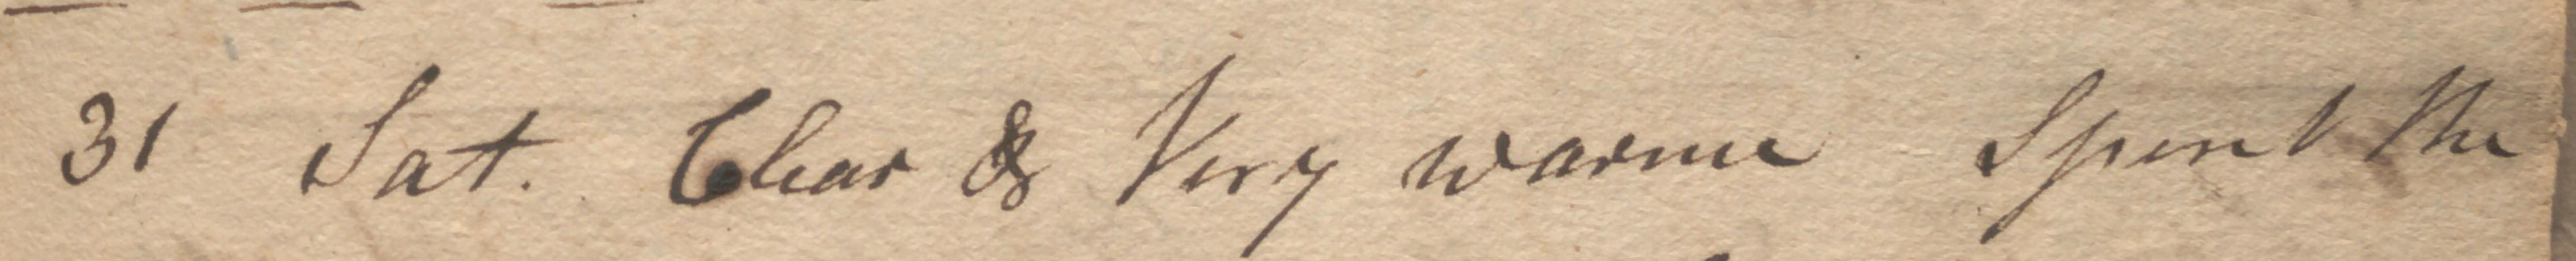31 Sat. Clear & Very warme spent the
